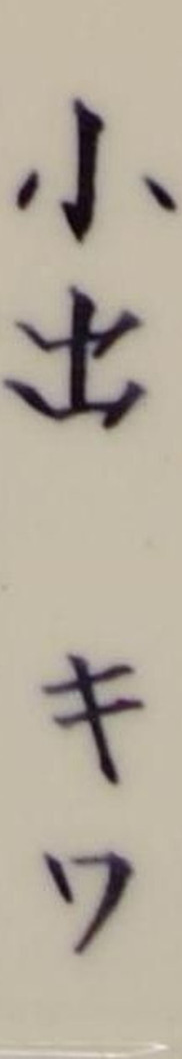小出キワ
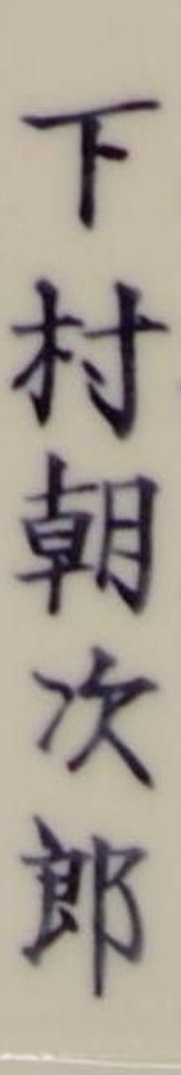下村朝次郎
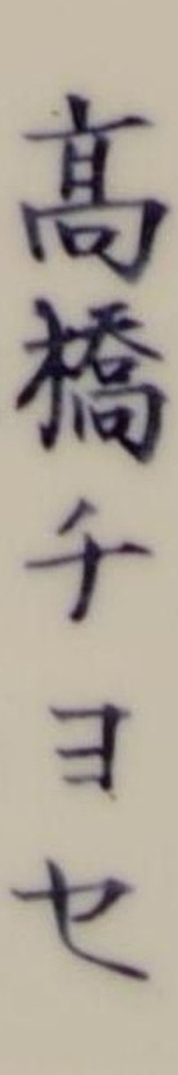高橋チヨセ
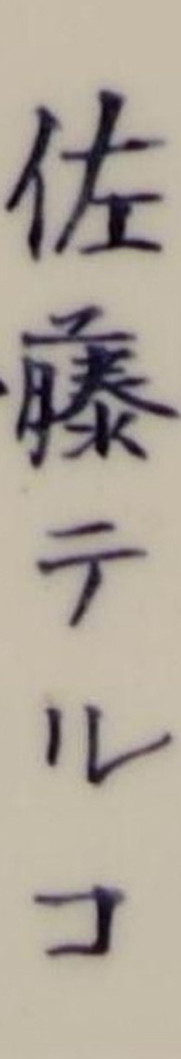佐藤テルコ
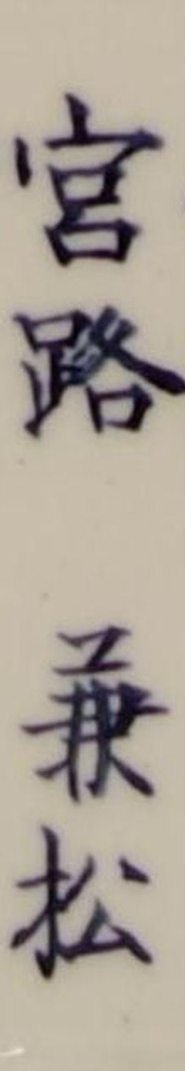宮路兼松
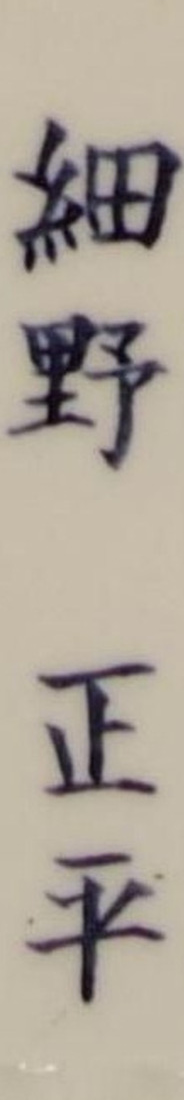細野正平
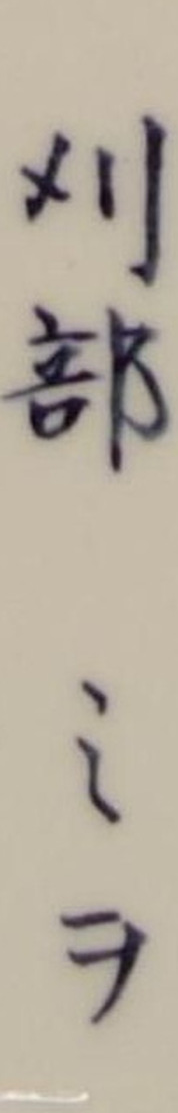刈部ミヲ
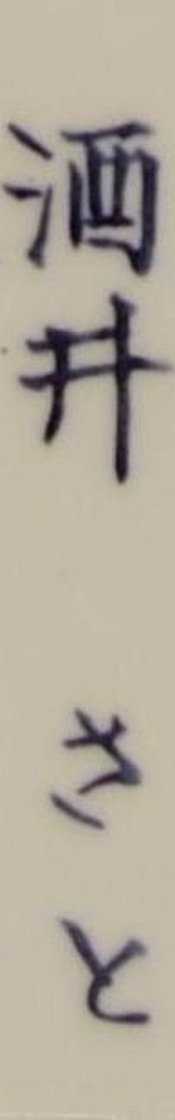酒井さと
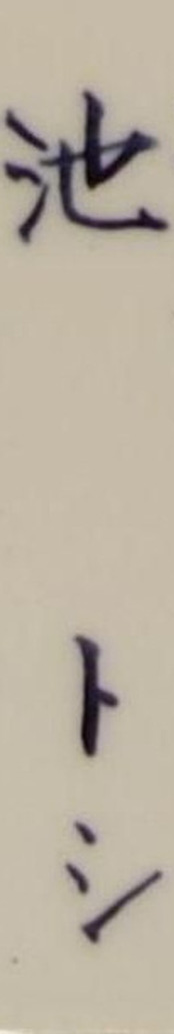池トシ
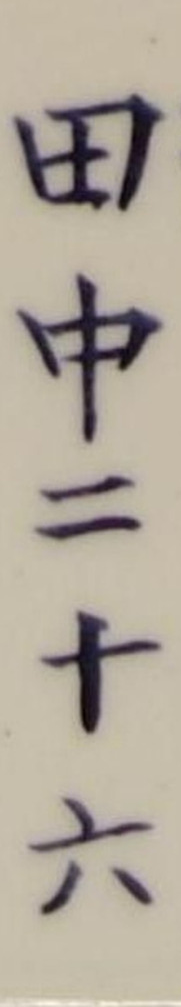田中二十六
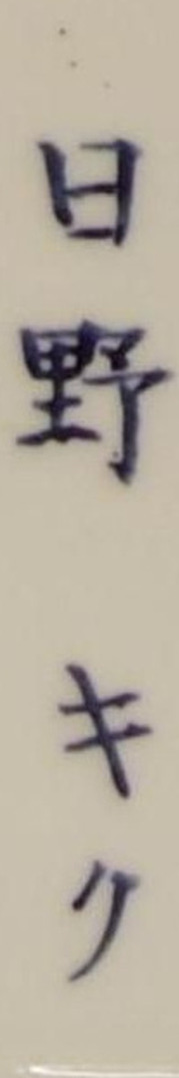日野キク
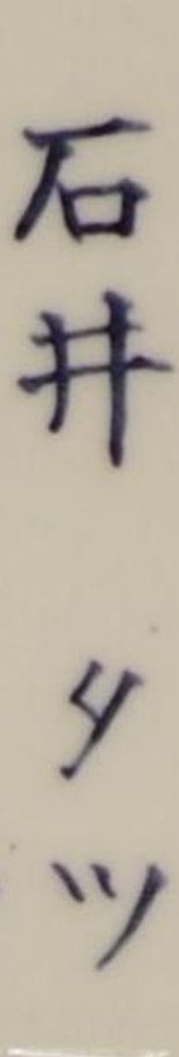石井タツ
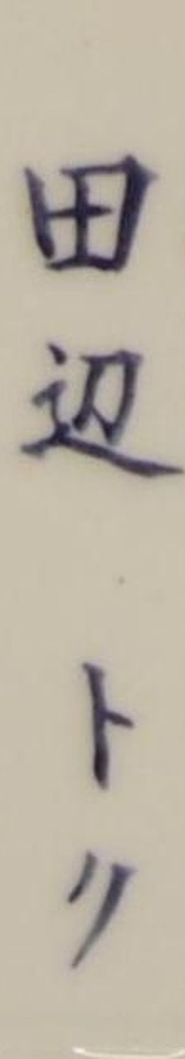田辺トク

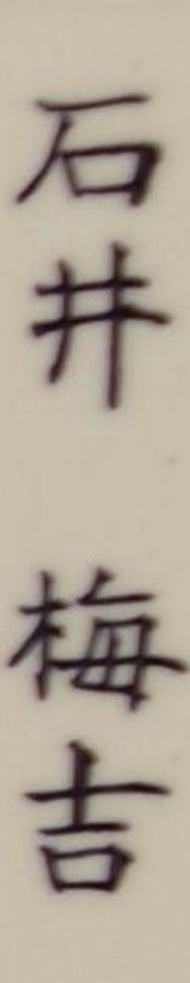石井梅吉
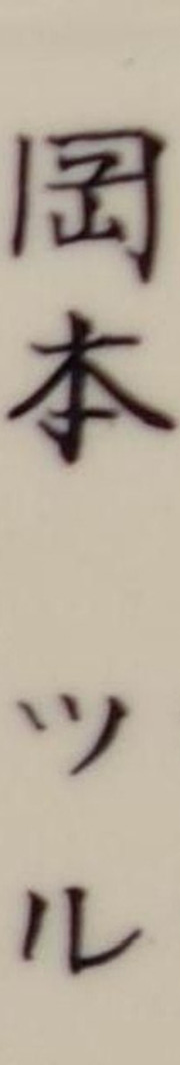岡本ツル
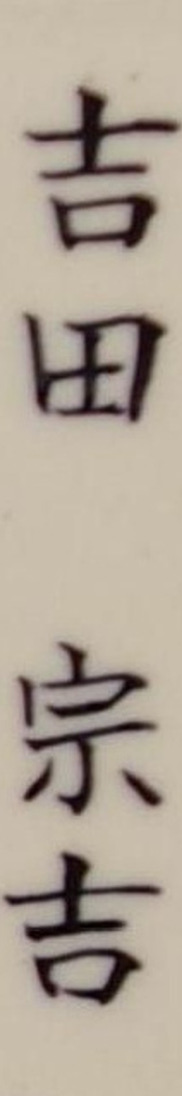吉田宗吉
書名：M~S
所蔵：高野山金剛峯寺
